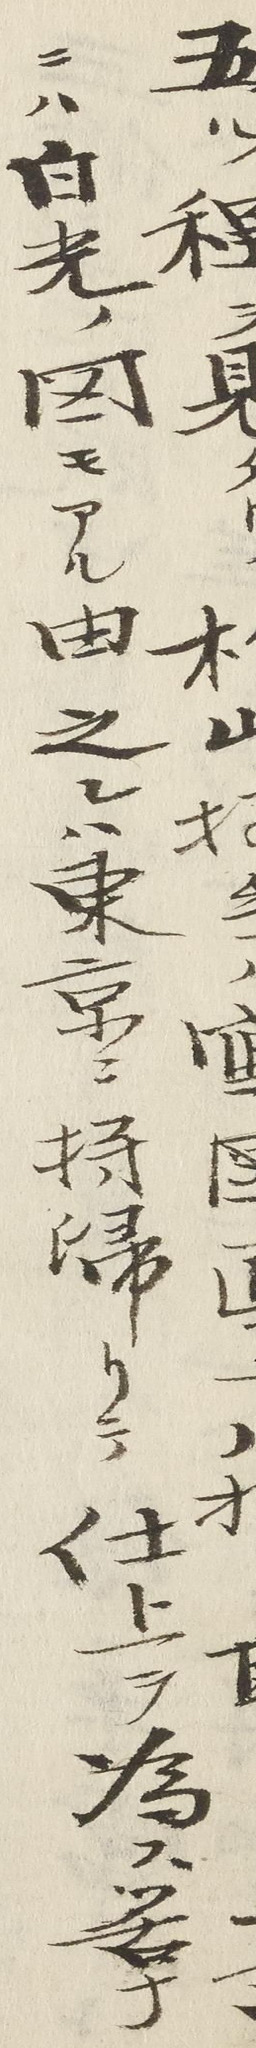ニハ白光ノ図モアル由之レハ東京二持帰リテ仕上ヲ為ス筈ナ
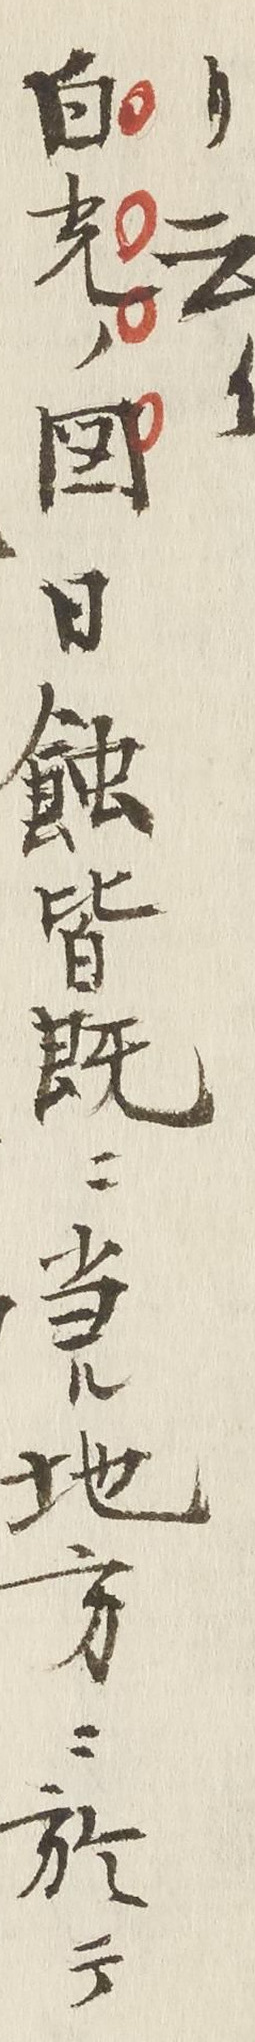白光ノ図日蝕皆既ニ当ル地方二於テ
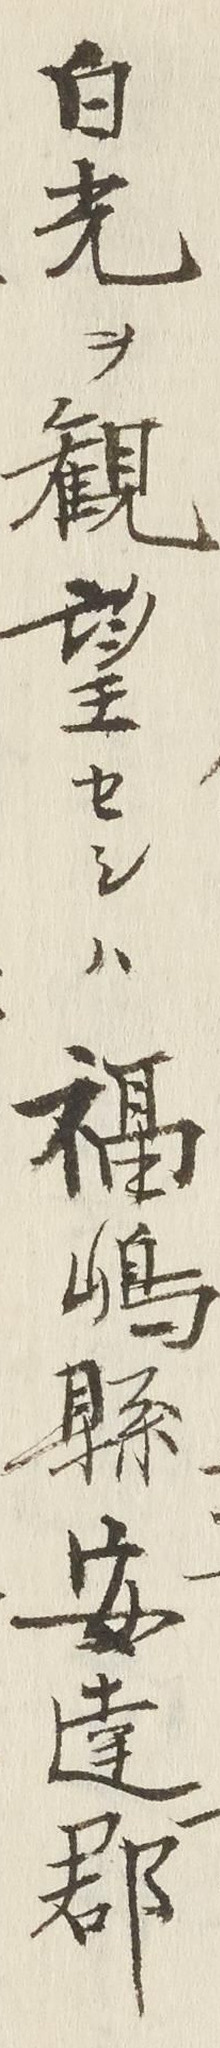白光ヲ観望セシハ福島県安達郡
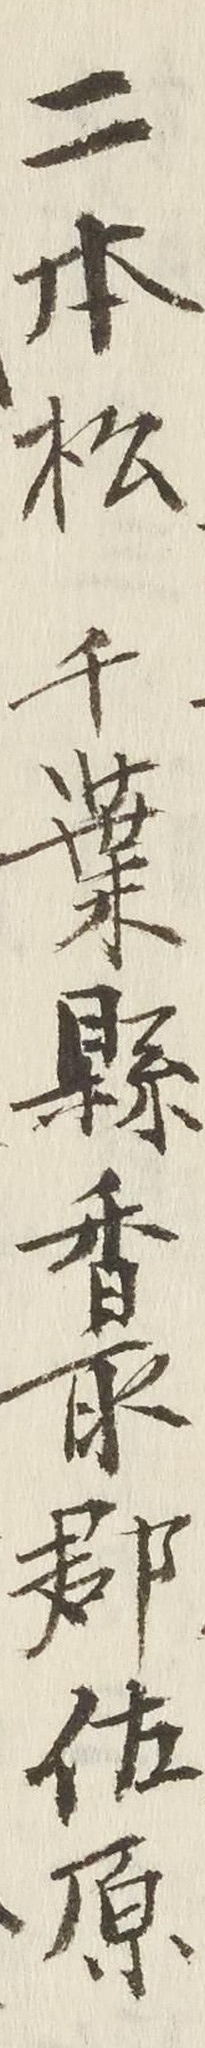二本松千葉県香取郡佐原
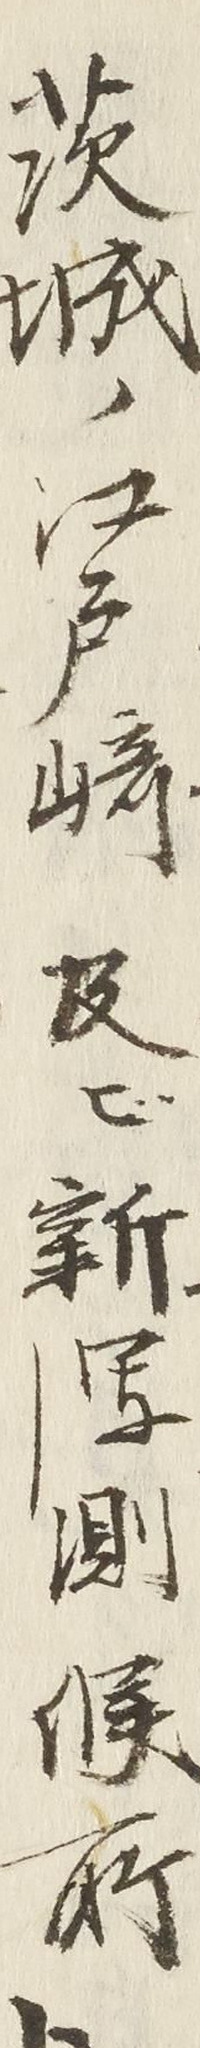茨城ノ江戸崎及ビ新瀉測候所
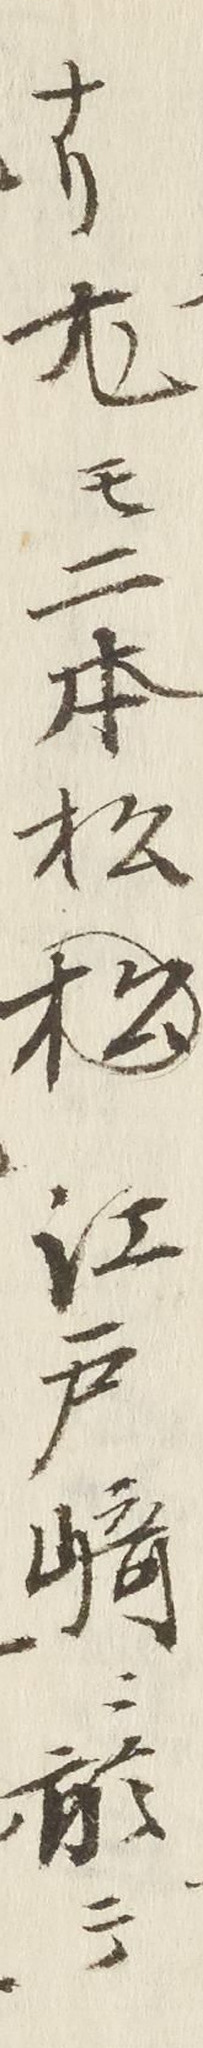ナリ尤モ二本松松江戸崎二於テ
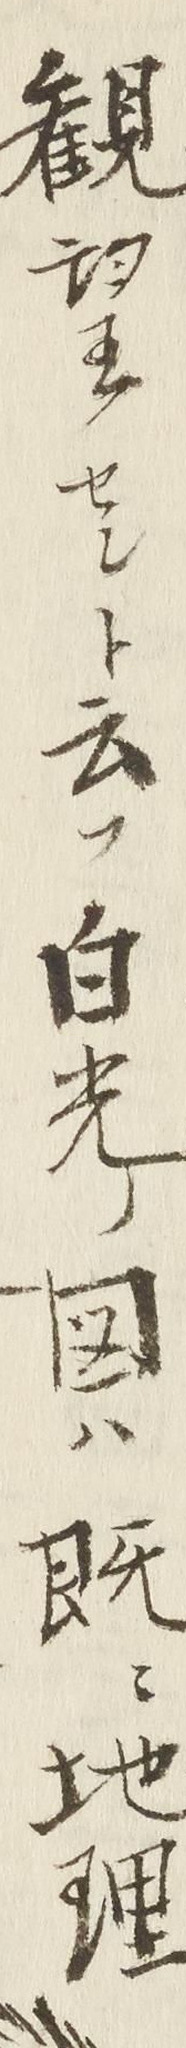観望セシト云フ白光ノ図ハ既二地理
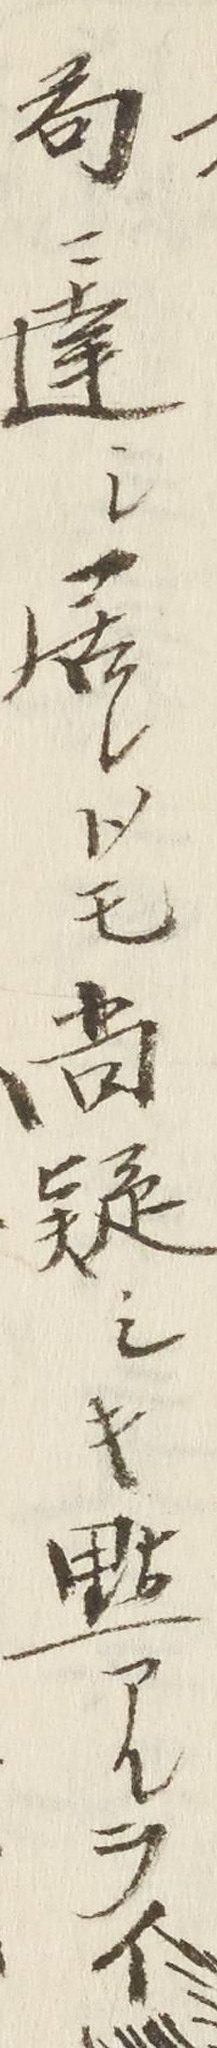局ニ達シ居レドモ尚疑シキ点アルヲ
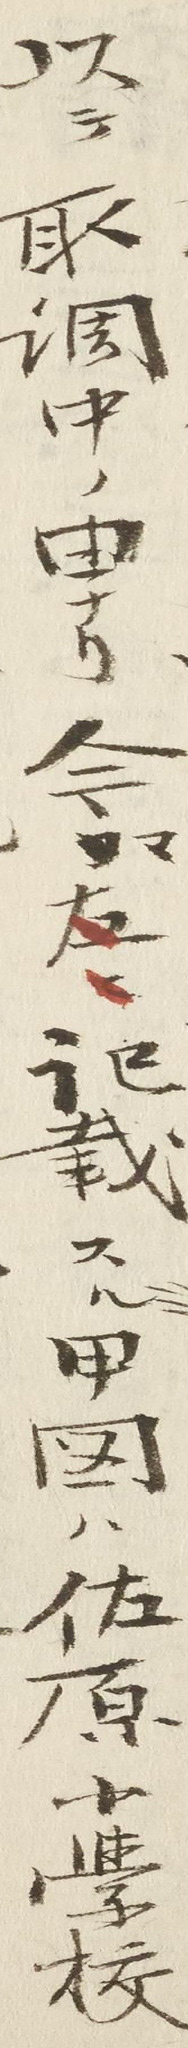以テ取調中ノ由ナリ今マ左二記載スル甲図ハ佐原小学校
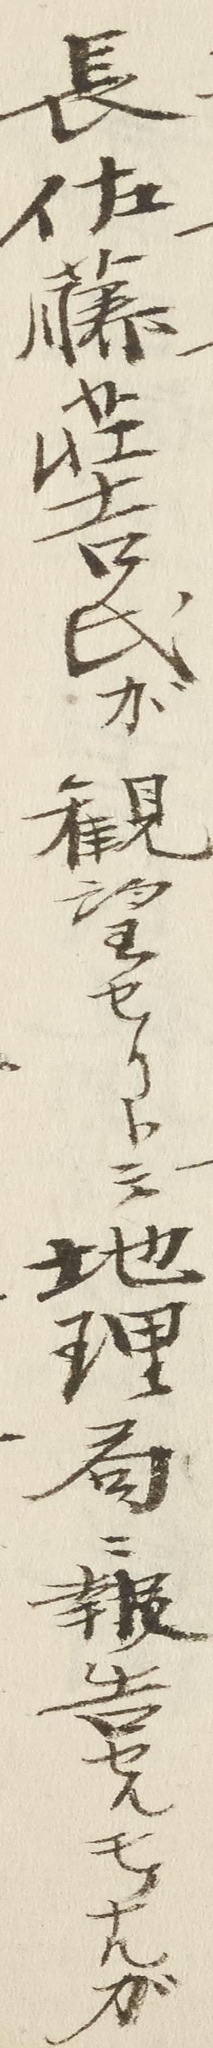長佐藤壮吉氏ガ観望セリトテ地理局ニ報告セルモノナルガ
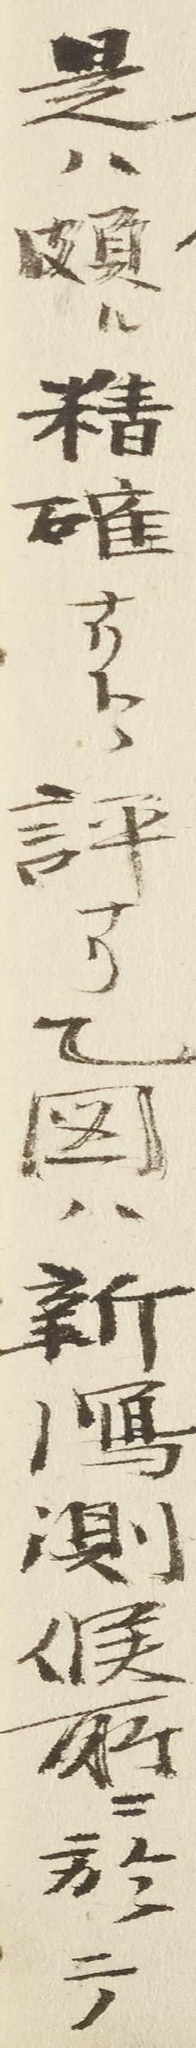是ハ頗ル精確ナリトノ評ナリ乙図ハ新瀉測候所二於テ
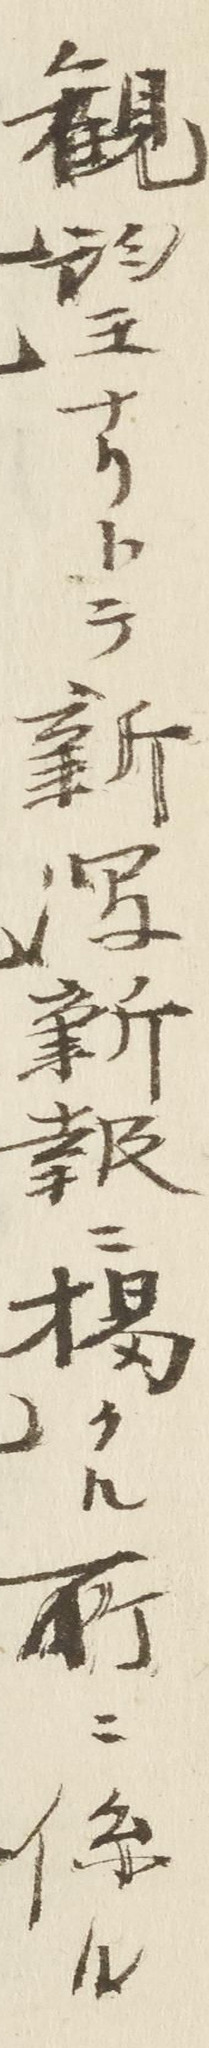観望ナリトテ新瀉新報ニ掲クル所ニ係ル
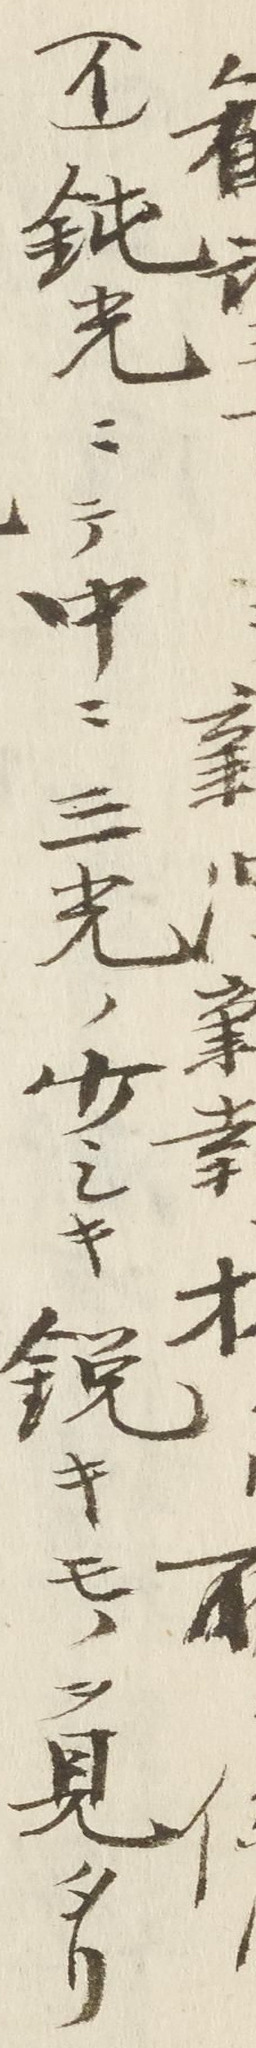鈍光ニテ中ニ三光ノ少シキ鋭キモノヲ見タリ
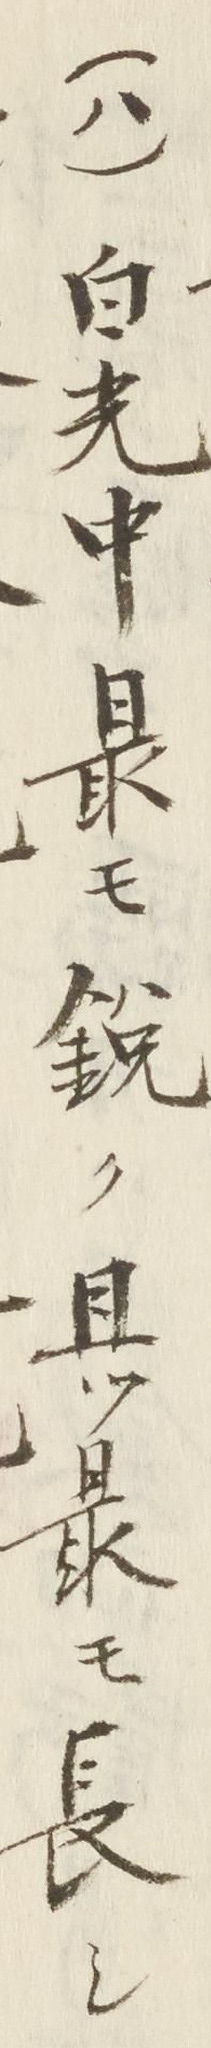白光中最モ鋭ク且ツ最モ長シ
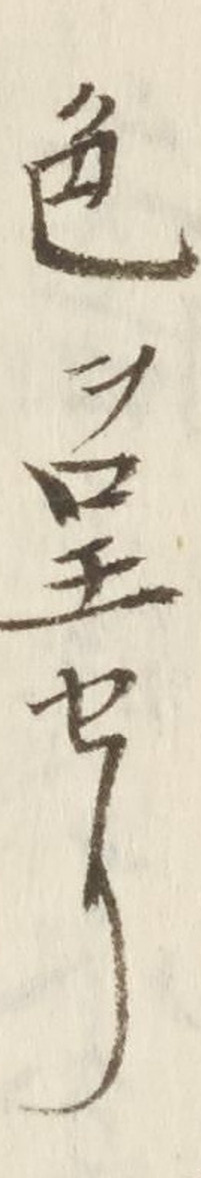色ヲ呈セリ
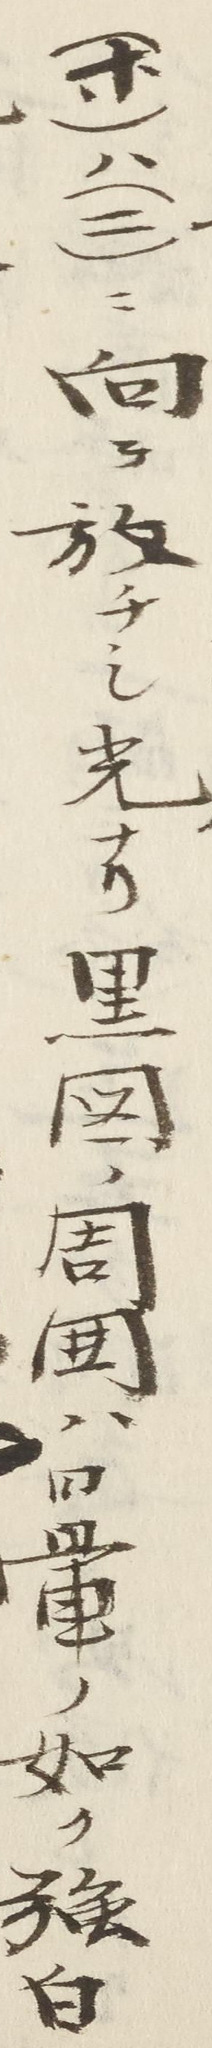ハ二向テ放チシ光ナリ黒図ノ周囲ハ日暈ノ如ク強白
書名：日蝕録　全
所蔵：東京大学地震研究所図書室 Earthquake Research Institute Library, The University of Tokyo, JAPAN
